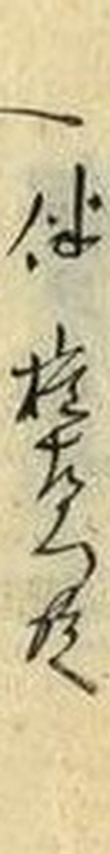伴権左衛門殿
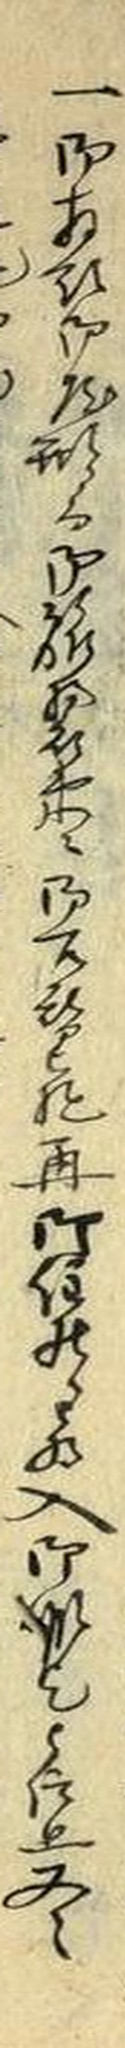一御拝領御屋形ニ而御旅装束ニ御召替被遊再御住居へ被為入御暇乞被仰上又々
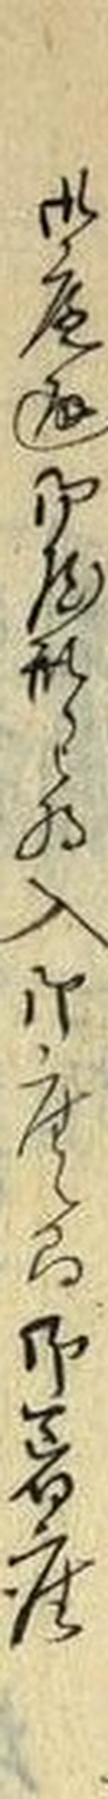御庭通御屋形へ被為入御座之間御着座
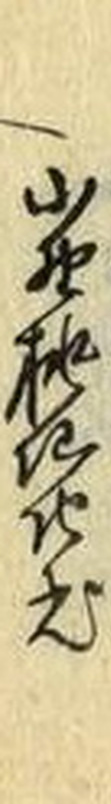小野桃仙院老
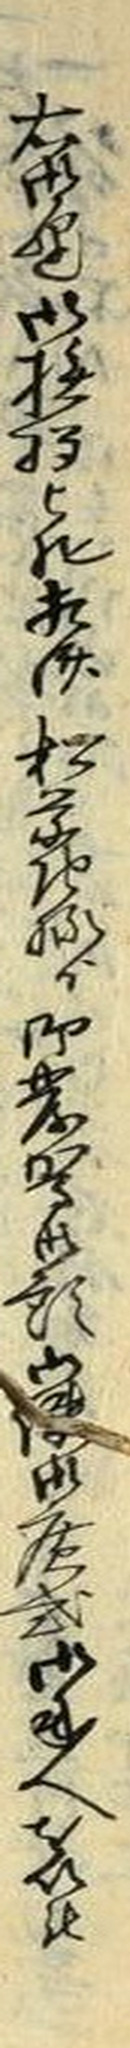右御逢御挨拶被遊相済松栄院様ゟ御発駕御歓御使御広式御用人を以被
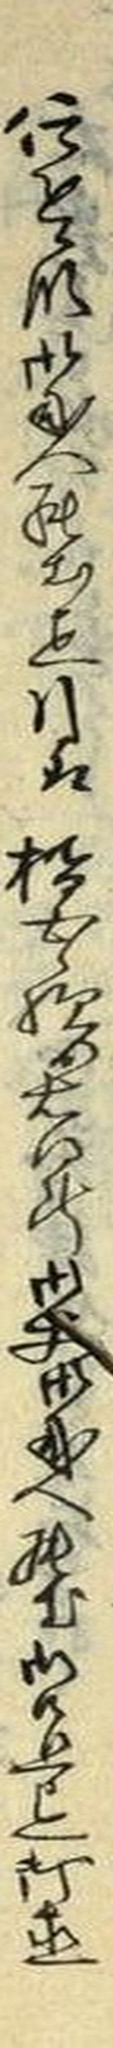仰進候段御用人罷出申上引取楷五郎様ゟ右同断御使御用人罷出御口上申上御直
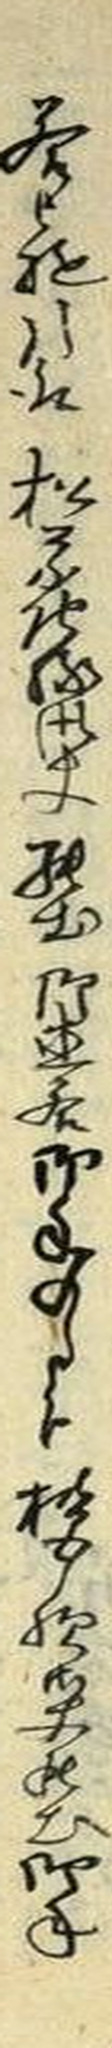答被遊引取松栄院様御使罷出御直答御手のし被下楷五郎様御使罷出御手
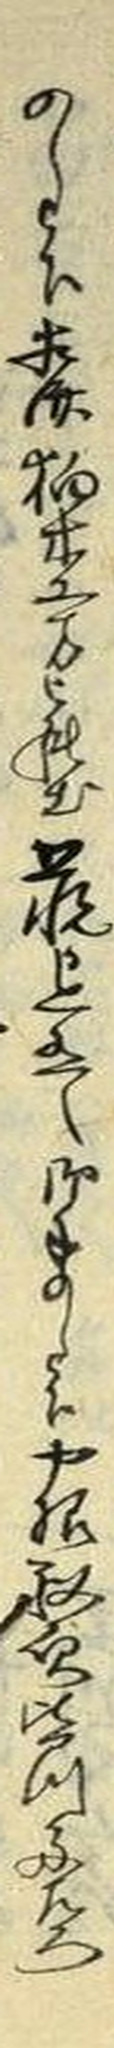のし被下相済狛杢方被罷出恐悦申上有之御手のし被下中根靱負皆川多左衛門
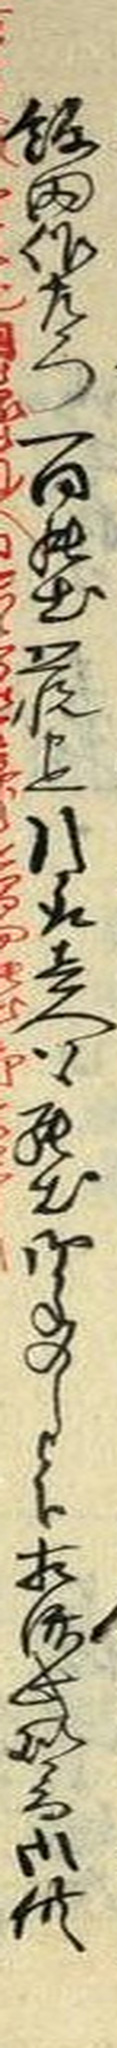飯田作左衛門一同罷出恐悦申上引取壱人ツヽ罷出御手のし被下相済此処ニ而御供
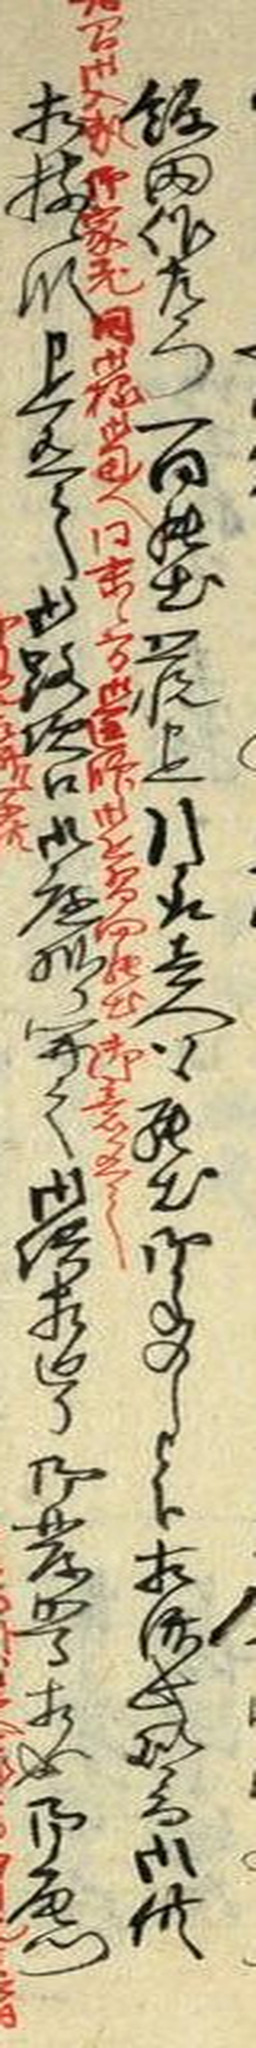相揃候段申上有之御路次口御庭掛り開之御供相廻り御発駕相成御唐門
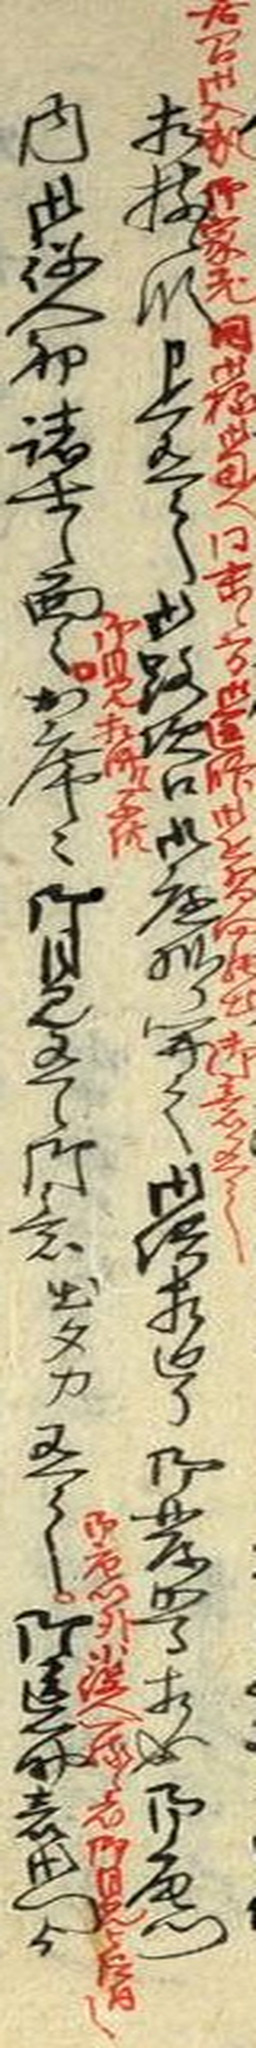内御役人初諸士之面々〇於席々御目見有之御意出タカ有之〇御道筋表御門ゟ
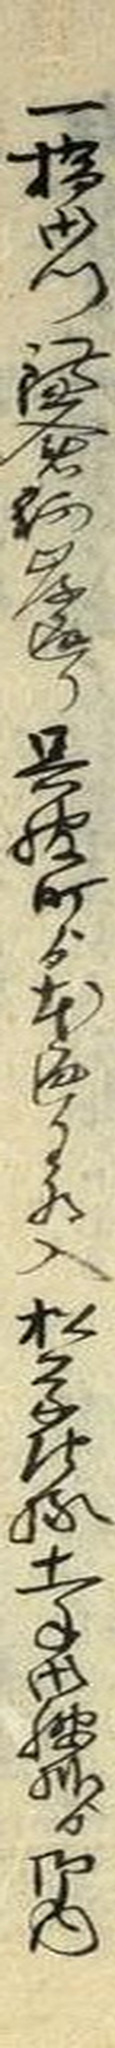一橋御門鎌倉河岸通り呉服町ゟ本通り被為入松栄院様土手御腰掛ゟ御内
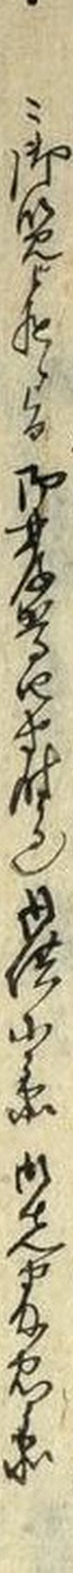々御覧被遊候旨御発駕四半時過御供小兵衛御先番忠兵衛
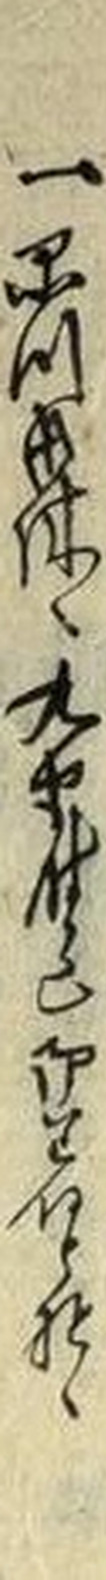一品川御休へ九半時過御着被遊候
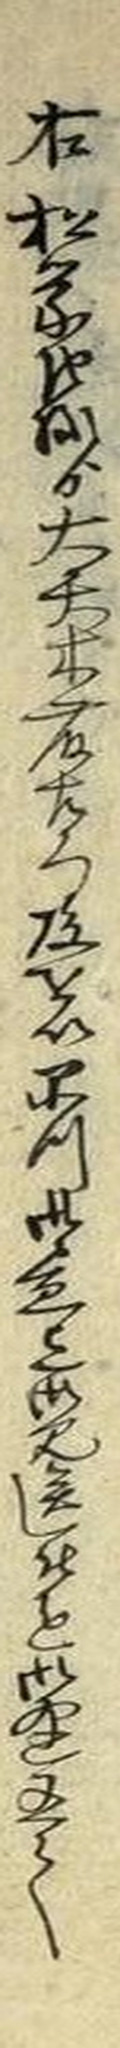右松栄院様ゟ大矢木藤左衛門殿を以品川御昼迄御見送被進御逢有之

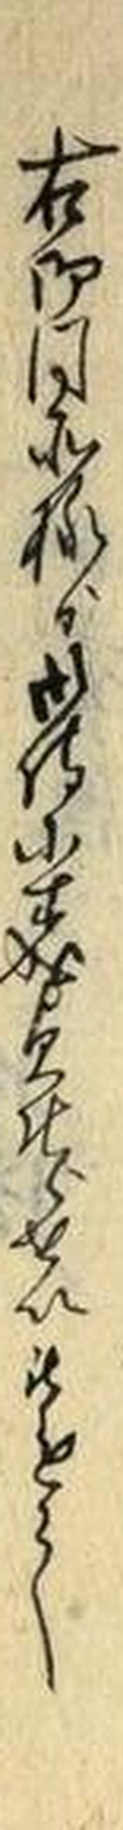右御同所様ゟ御侍小森貞次郎を以被進之
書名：少傅日録抄（斉善付側向頭取日記、江戸并道中、初入在国、逝去後…
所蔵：福井県文書館 Fukui Prefectural Archives
